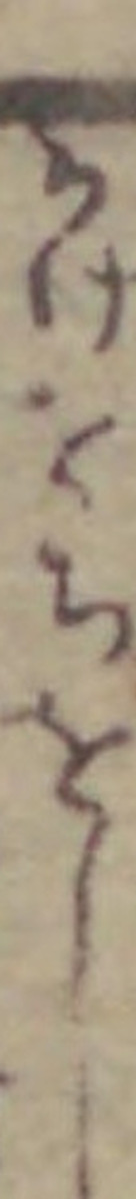かけをちをし
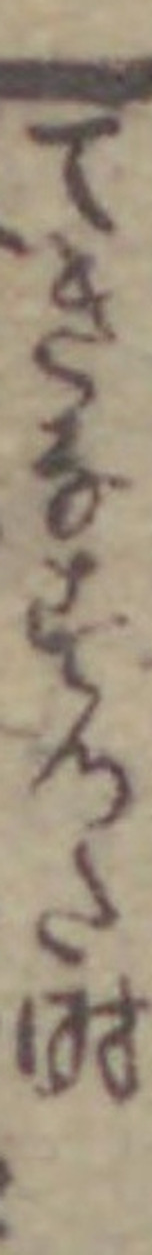てきなすつた時
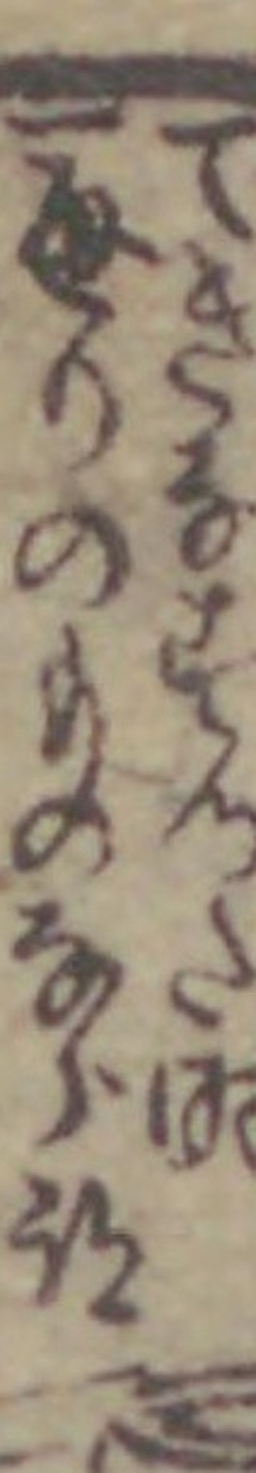一通りのものなら跡
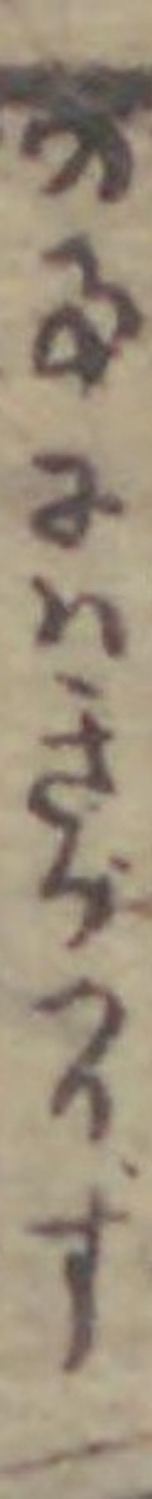の事にはきがつかす
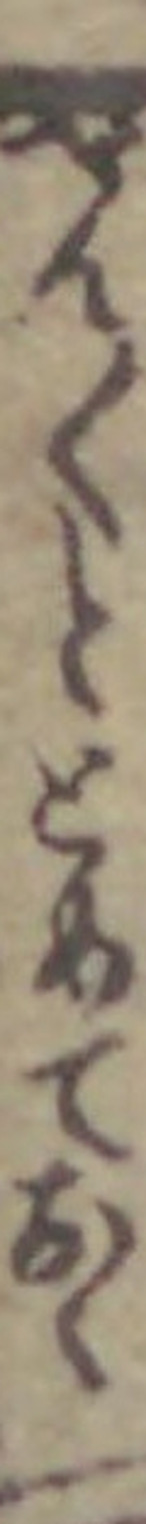ん〳〵ととめておく
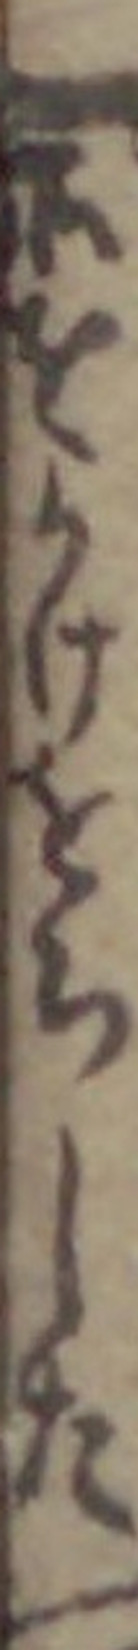所をかけをちした
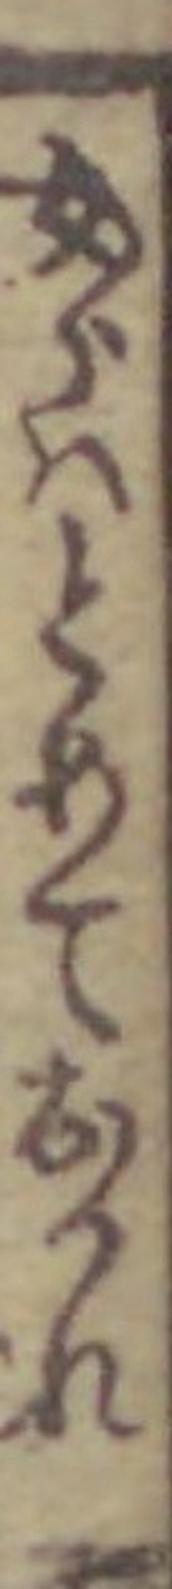女郎はとめておかれ
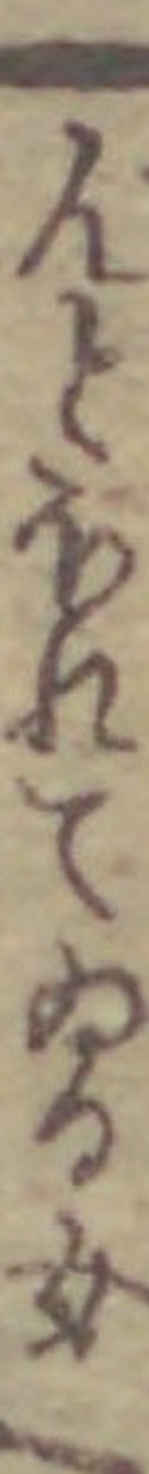んとほれてゐる女
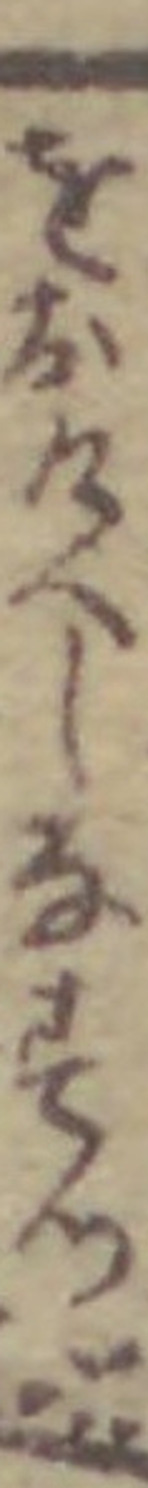をおけへしなすつ
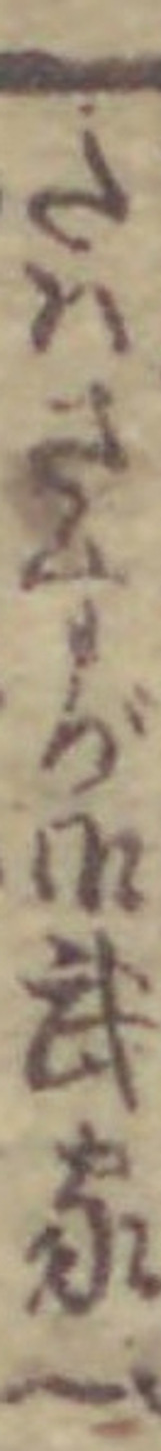たはさすが御武家
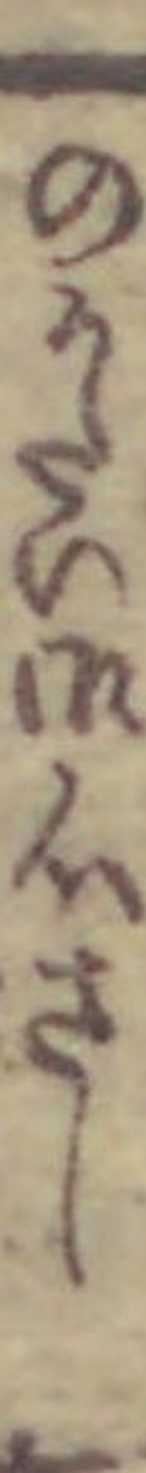のかたい御心さし
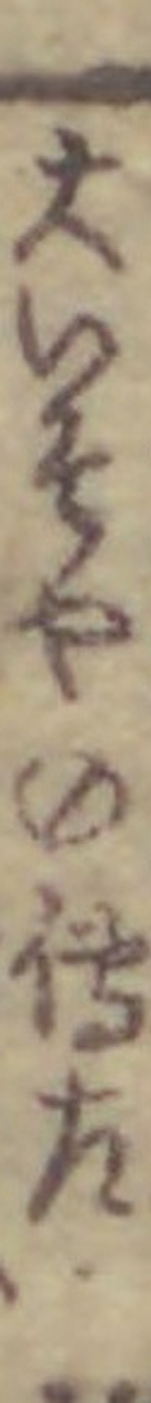大いそやの傳左
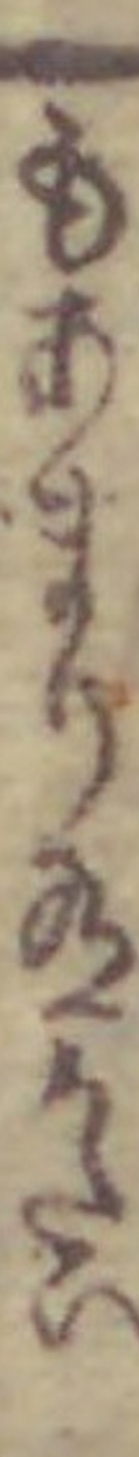もあまり有かたい
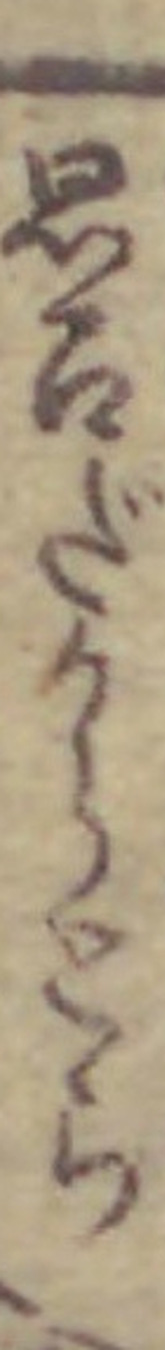思召だからとら
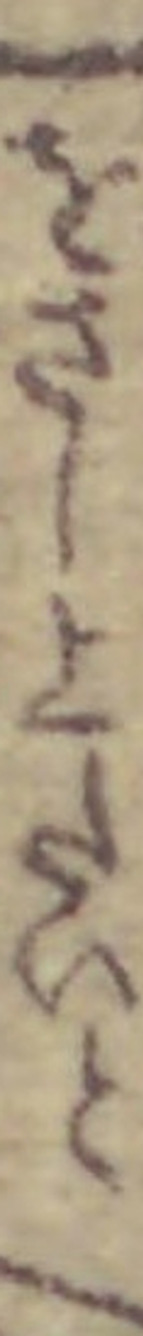をさし上たいと
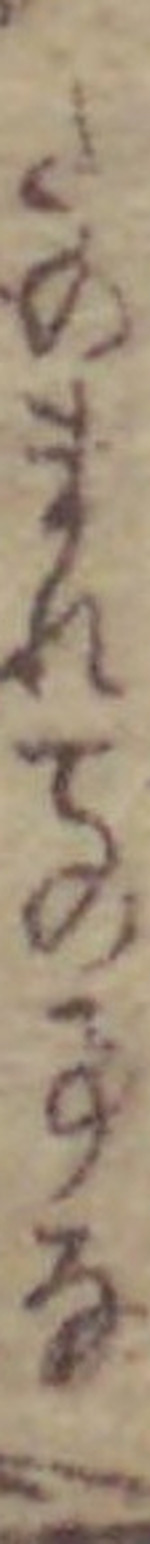たのまれての事な
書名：間似合嘘言曽我 3巻
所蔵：国立国会図書館 National Diet Library, JAPAN
